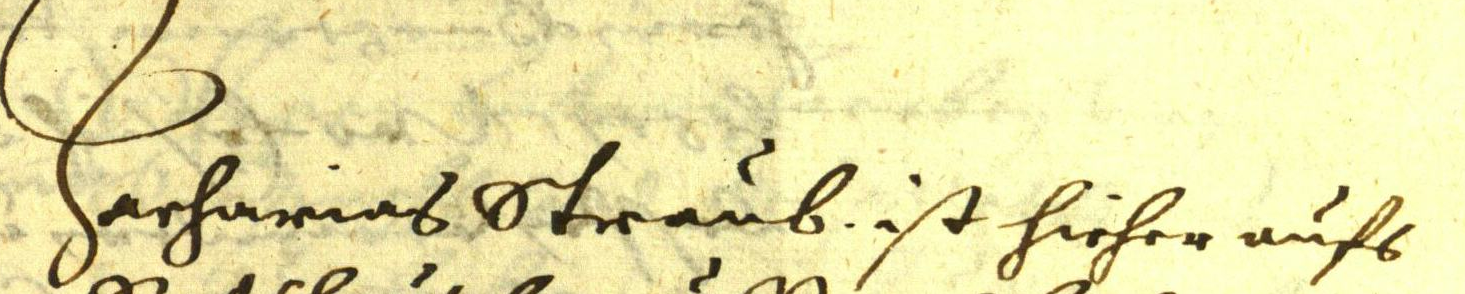Zacharias Straūb. ist hieher aūfs
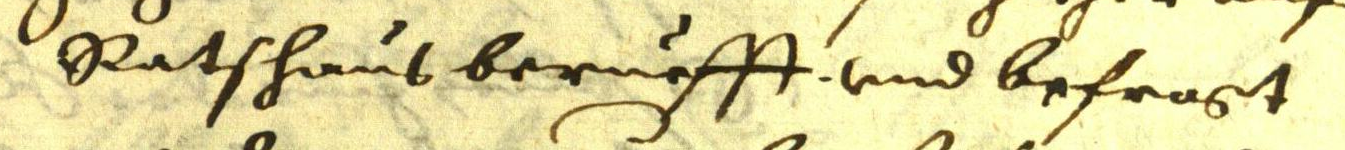Ratshaūs berūefft. vnd befragt
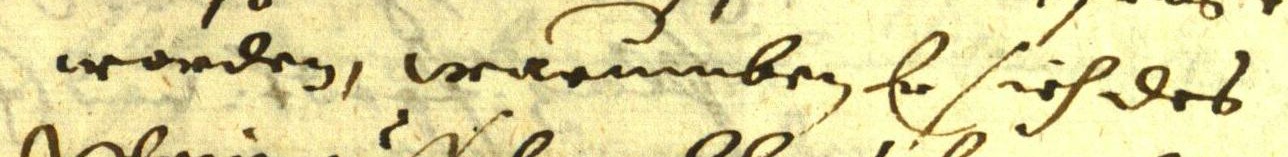worden, warūmben Er sich des
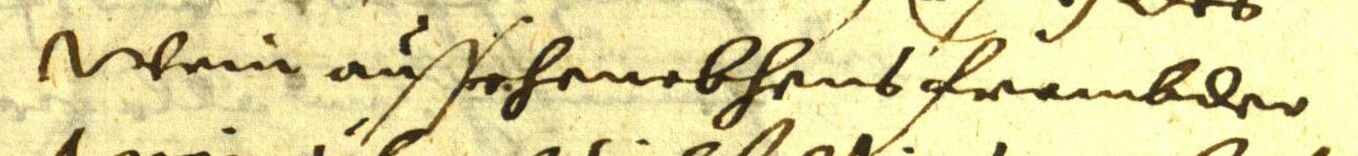Wein aūsschenckhens frembder
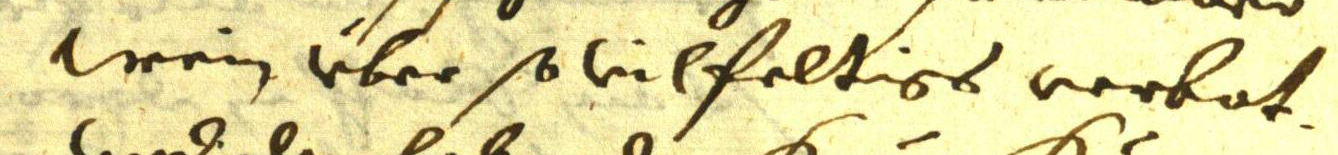Wein v̈ber so vilfeltigs verbot.
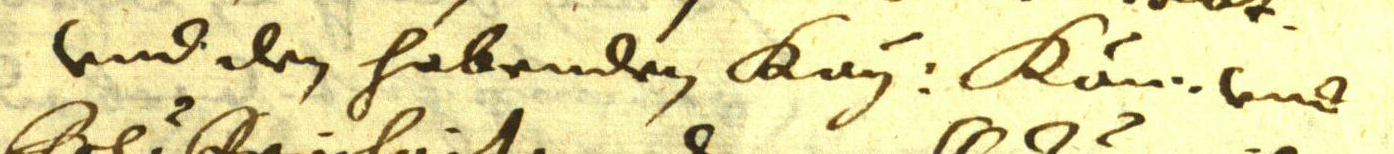vnd den habenden Kaȳ: Kōn: vnd
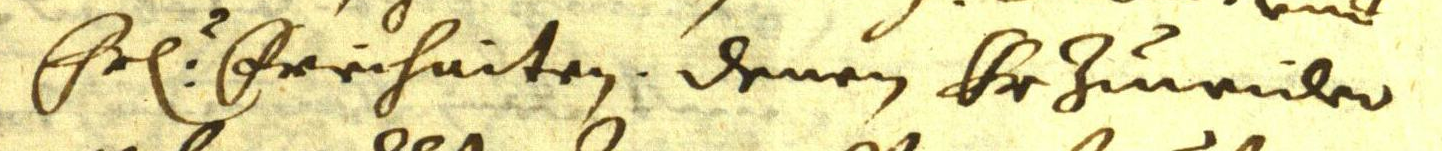Frl: Freihaiten. denen Er Zūwider
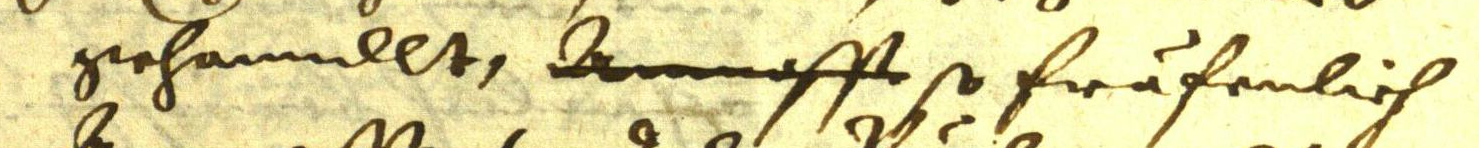gehanndelt, Anmasse so frāfenlich
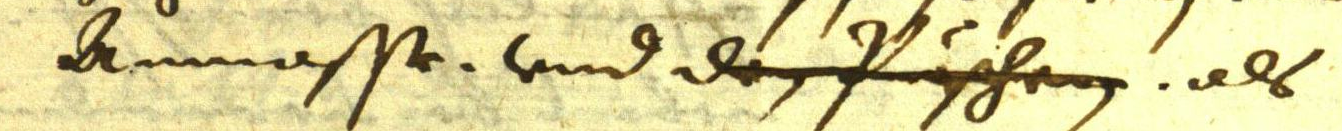Anmasse. vnd den Puschen. als
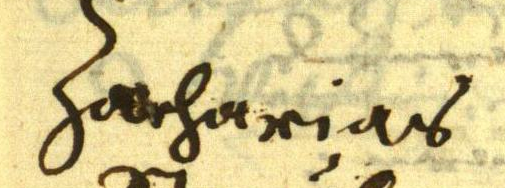Zacharias
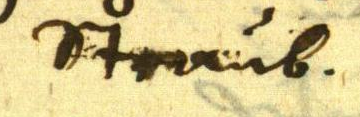Straūb.
